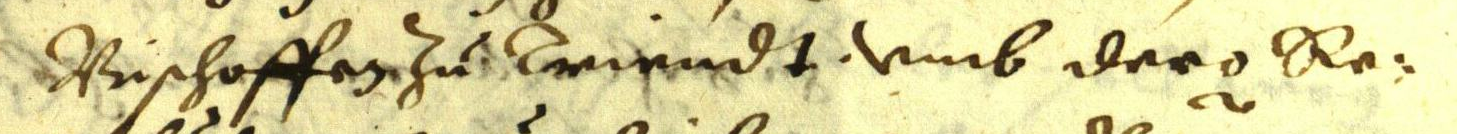Bischoffen Zū Triendt. vmb dero Re¬
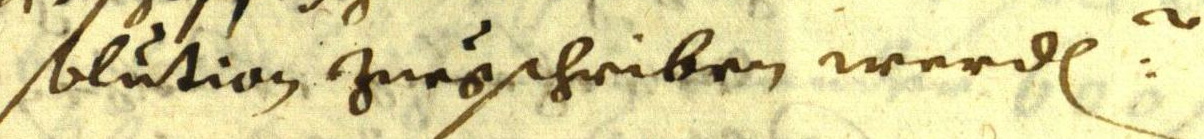solūtion Zūegschriben werd:
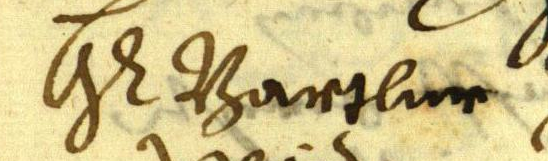H Bartlme
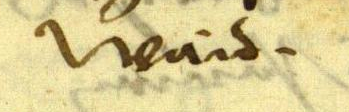Waid.
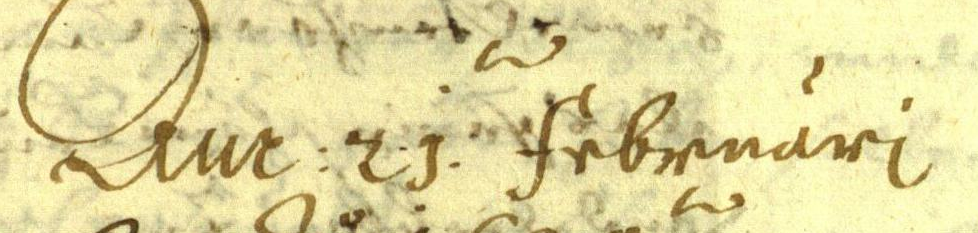Am: 21t. Febrūarj
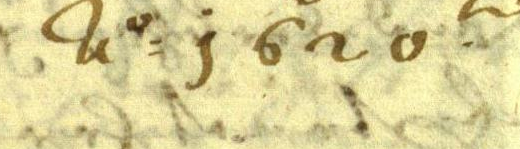Ao: 1620t.
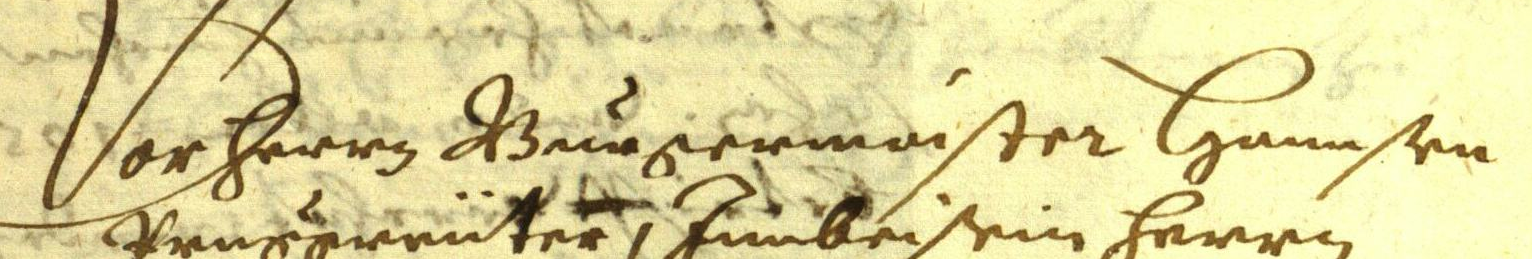Vor herrn Būrgermaister Hannsen
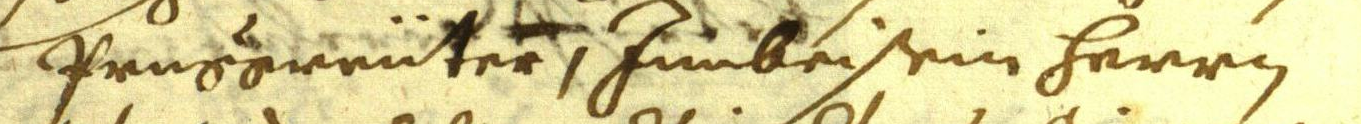Prūggreüter, Innbeisein herrn
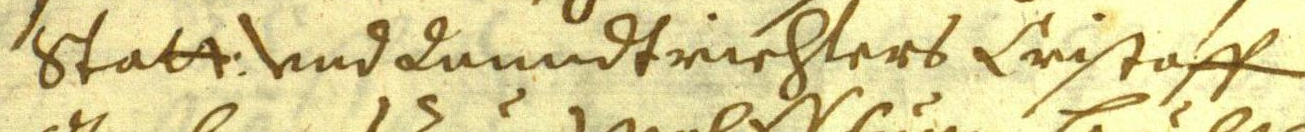Statt: vnd Lanndtrichters Cristoff
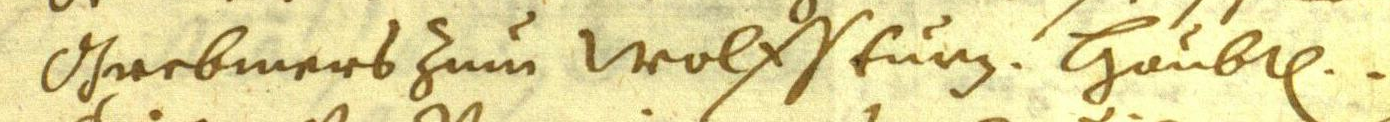Grebmers Zūm Wolfstūrn. Haūbt.
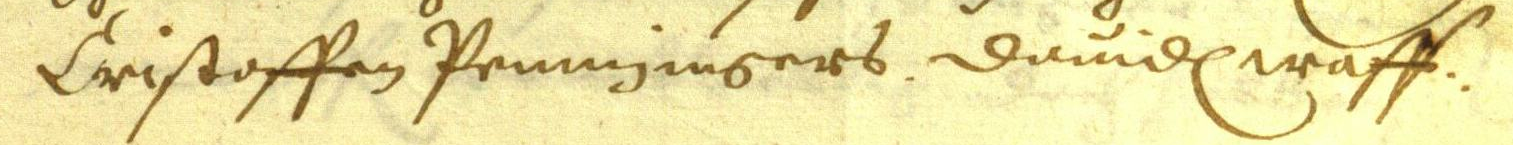Cristoffen Pennzingers. daūid Waff¬
